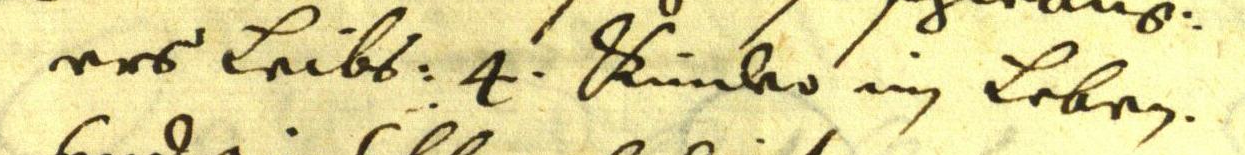ers Leibs: 4. Kinder im Leben.
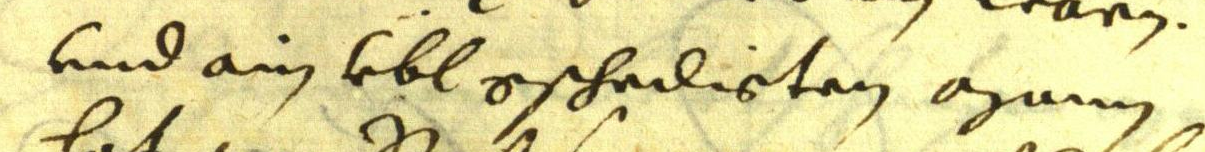vnd ain v̈bl gschedigten Mann
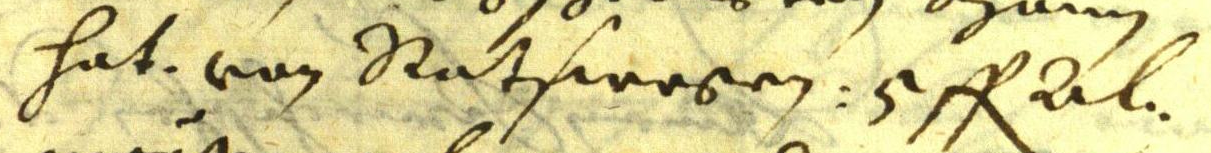hat. von Ratswegen: 5 fl Al¬
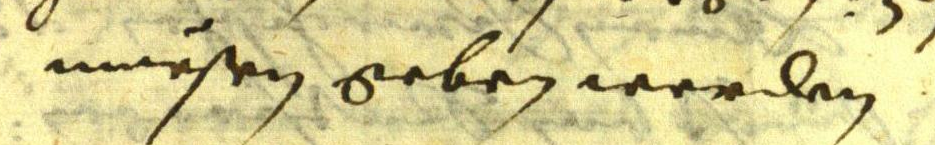mūesen geben werden
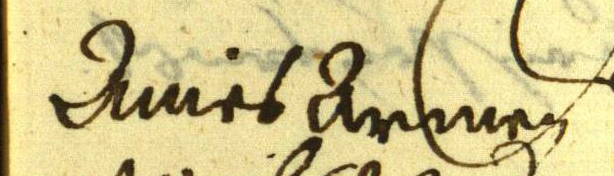Aines Armen
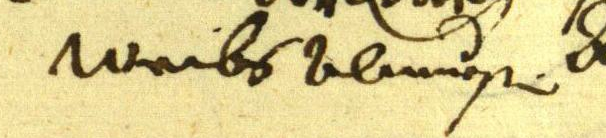Weibs Almūesen.
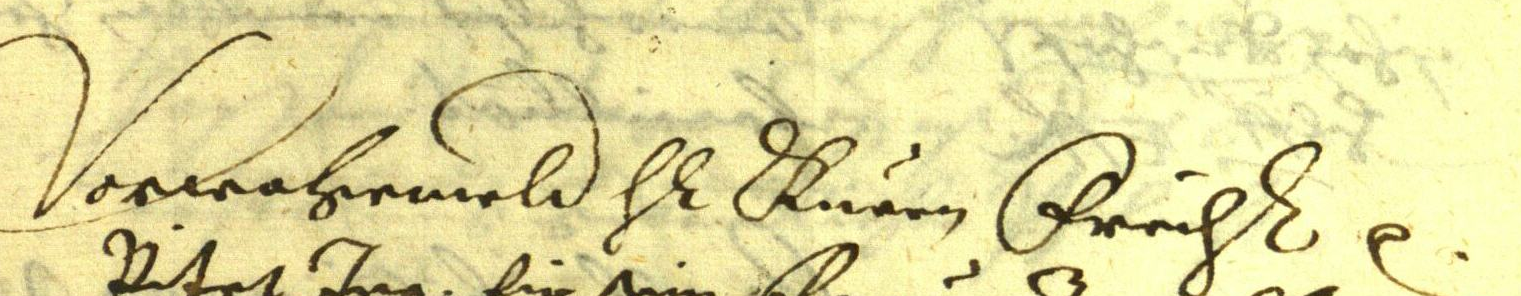Vorwolgemelt hl Kūeen Freih etc.
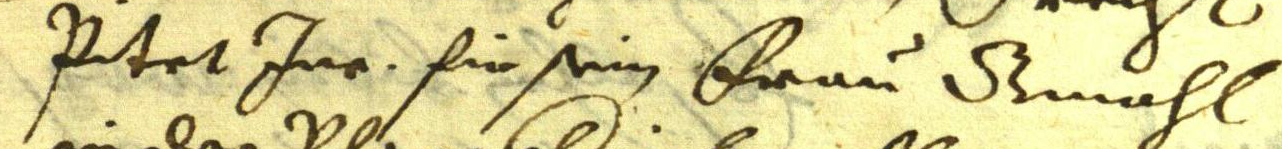Pitet Ine. fir sein Fraū Gmahl
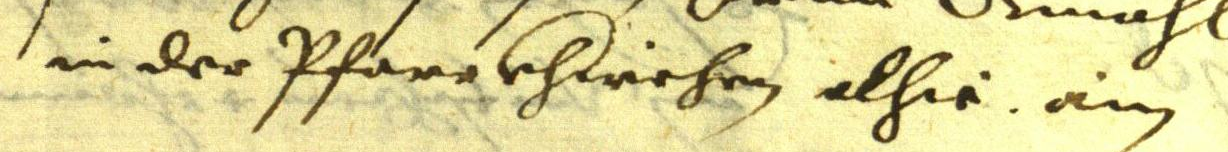in der Pfarrkhirchen alhie. ain
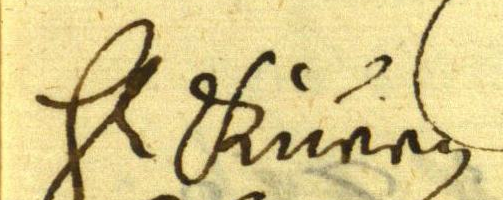Hl Kūeen
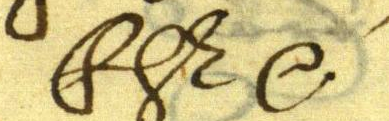Fh etc.
